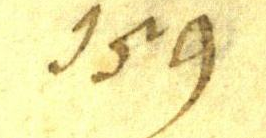159
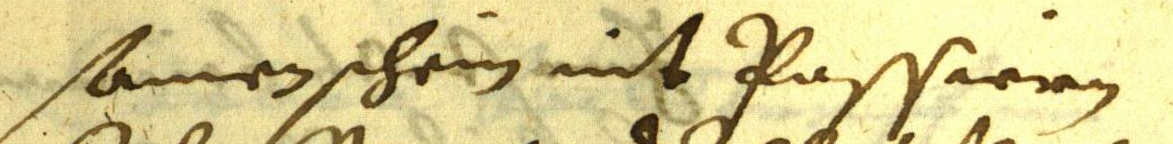samen schein nit Passiern
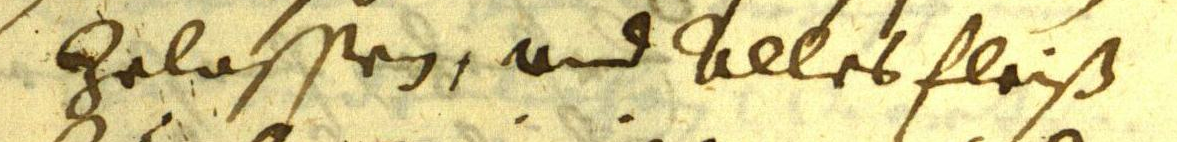Zelassen, vnd Alles fleiß
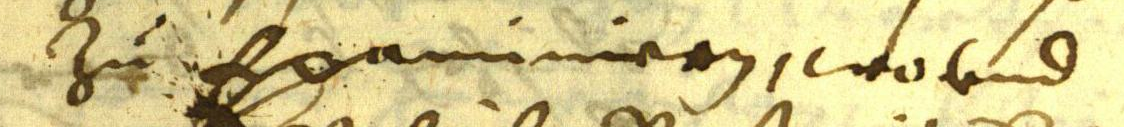Zū Examiniern, wo vnd
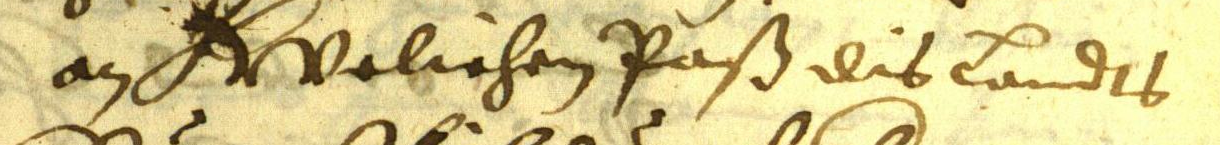an Welichen Paß dis Landts
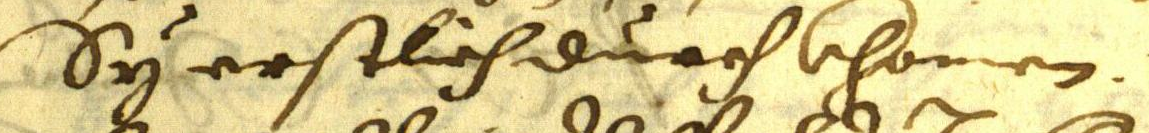Sȳ erstlich dūrch khomen.
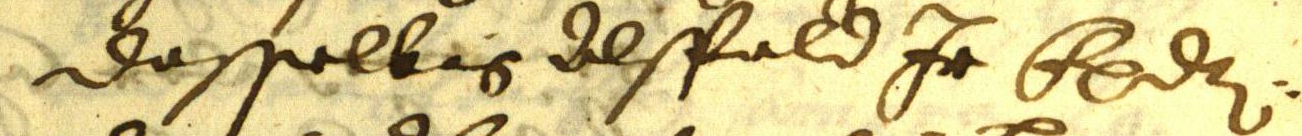dasselbig AlsPald Ir Fl dt:
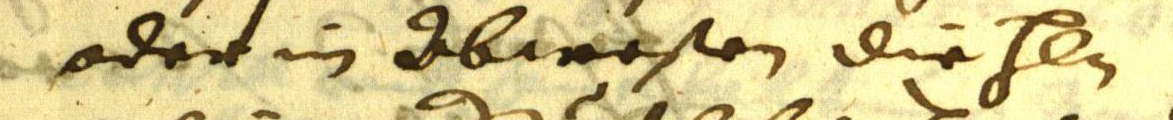oder in Abwesen die hln
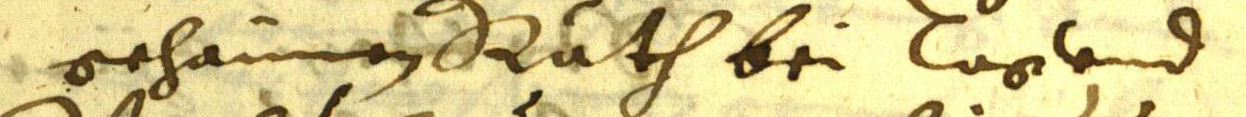gehaimen Rāth bei Tag vnd
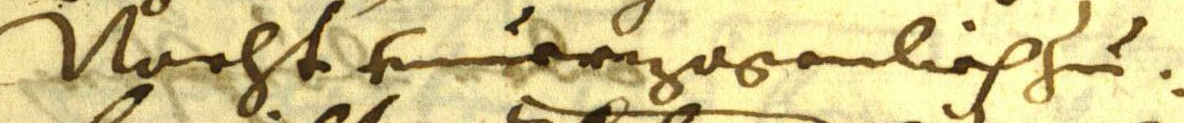Nacht vnūerzogenlich Zū¬
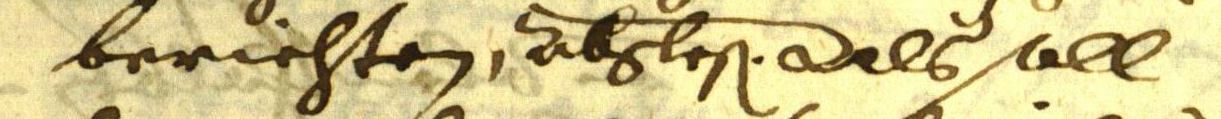berichten, Abgles. Als soll
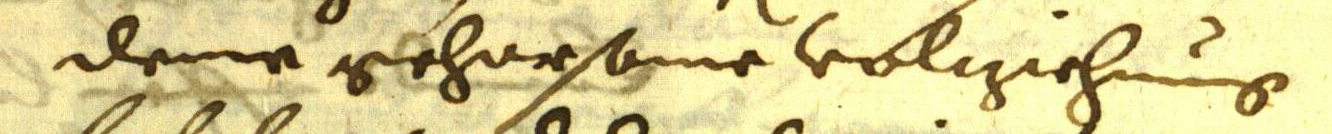deme gehorsame volziehūng
